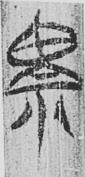○（鬼）
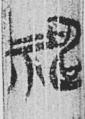神
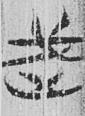武
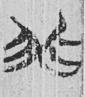非
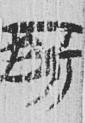所
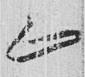㠯（以）
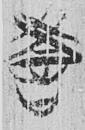○（教）
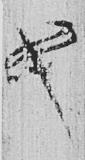民
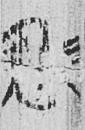唯
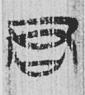君
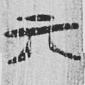亓
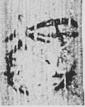智（知）
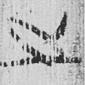之
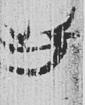此
